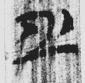之
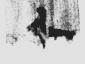內（入）
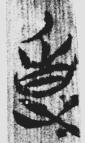事（仕）
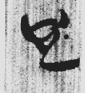也
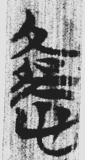愇（回）
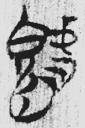既
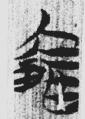○（聞）
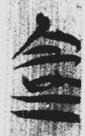命
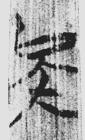矣
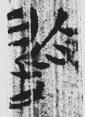敢
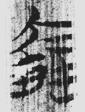{尒䎽}（問）
